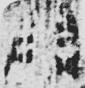凡
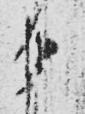人
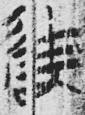唯（虽）
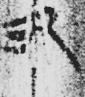又（有）
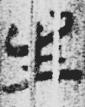生（性）
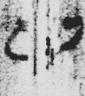心
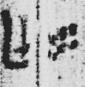亡（無）
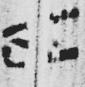正（定）
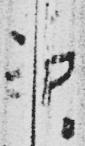志
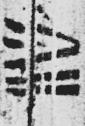歨（待）
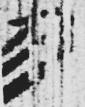勿（物）
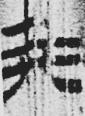而
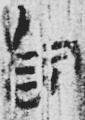句（後）
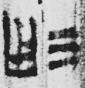乍（作）
